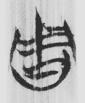周
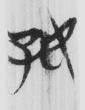好
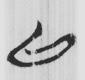㠯（以）
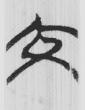交
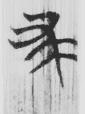求
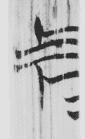上下=
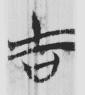吉
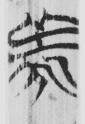羕
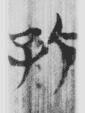孤
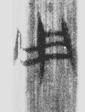用
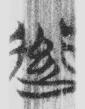{行幺止}
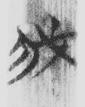我
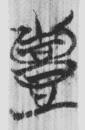壹
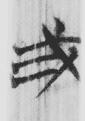弍
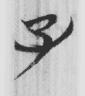子
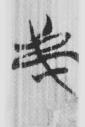弟
